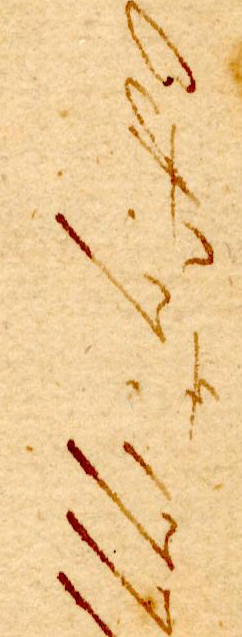Oct^r 7^th 1777
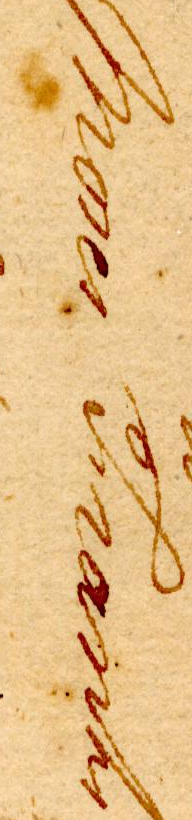Moses Franks
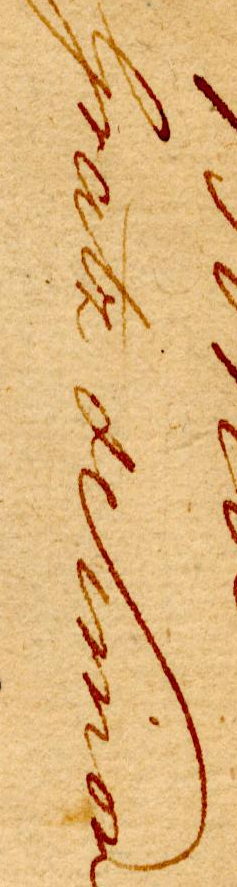Gratz & Simon
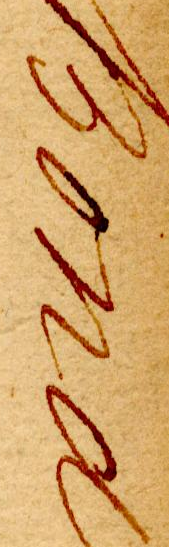Bond
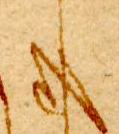To
